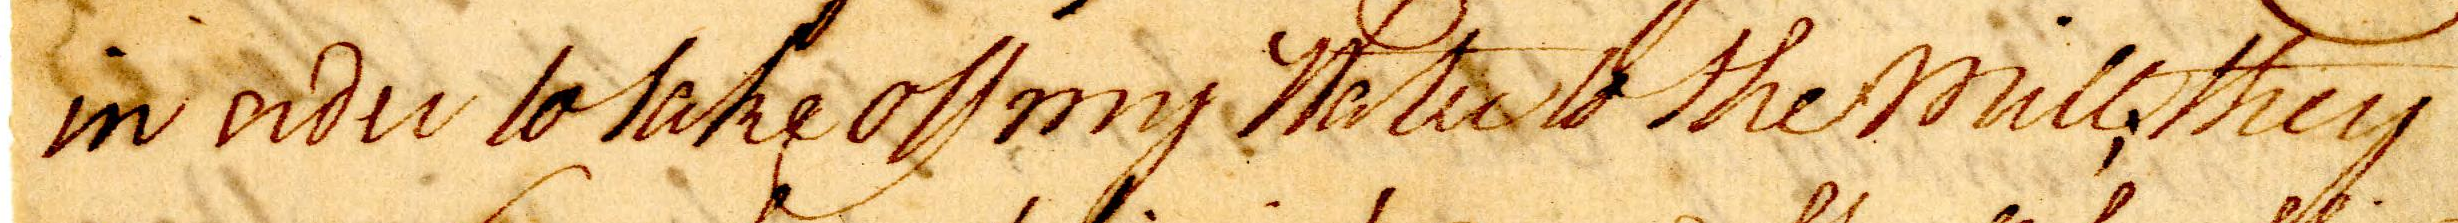in order to take off my Water to the mill, they
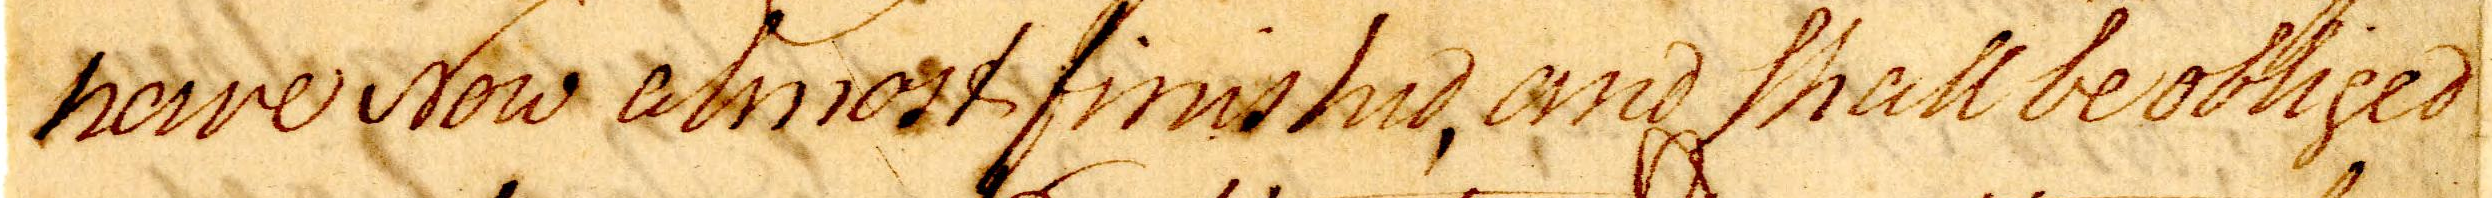have Now almost finished, and shall be obliged
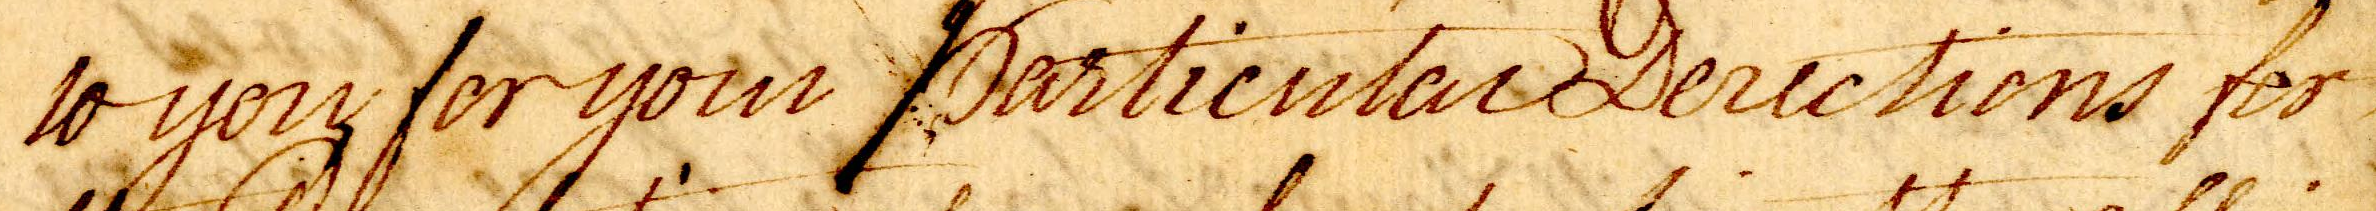to you for your Particular Derections for
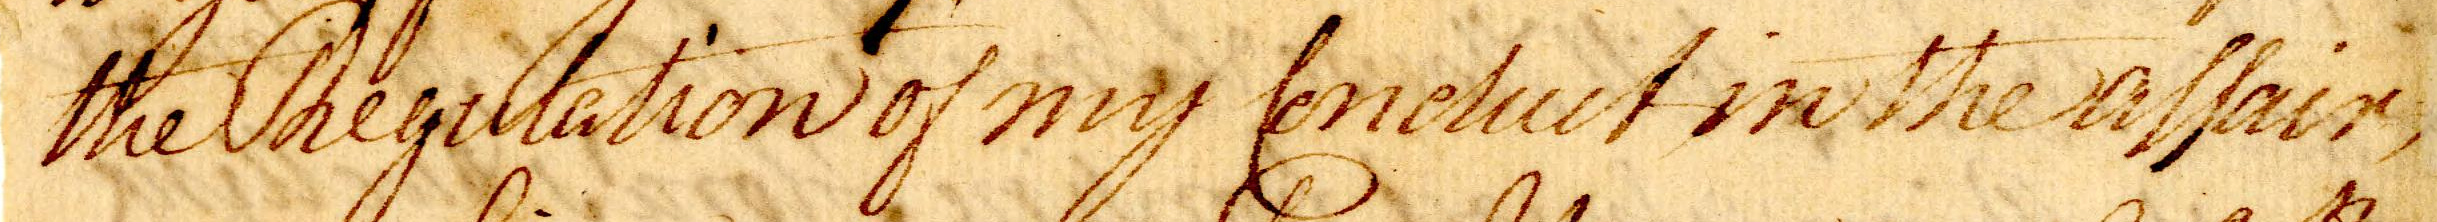the Regulation of my Conduct in the affair,
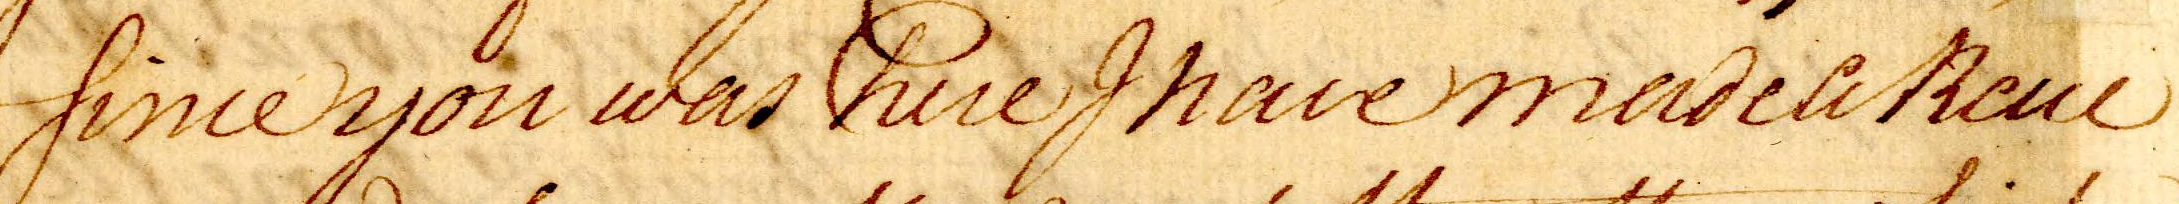Since you was here I have made a Race
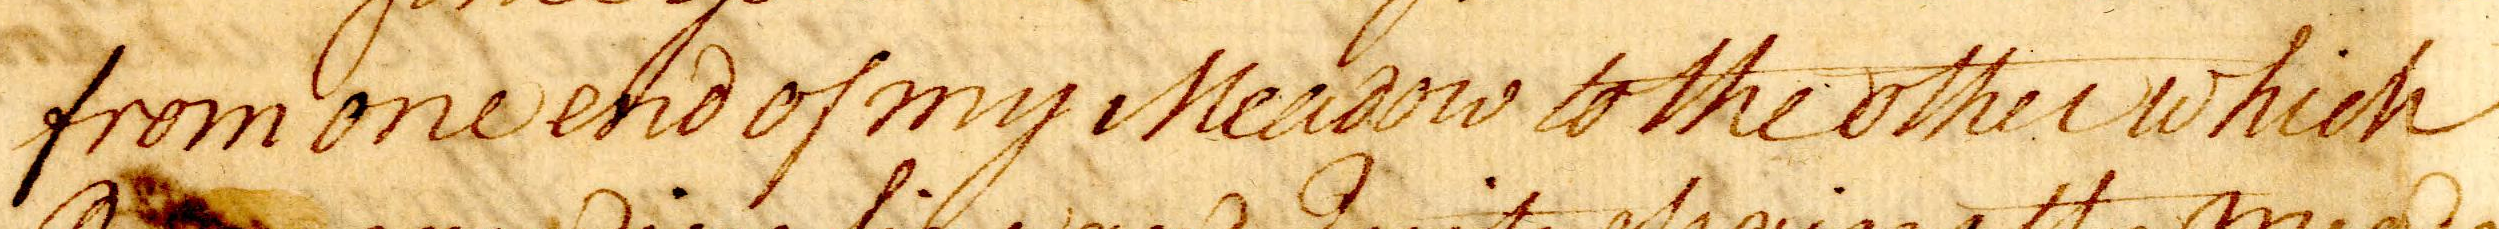from one end of my Meadow to the other which
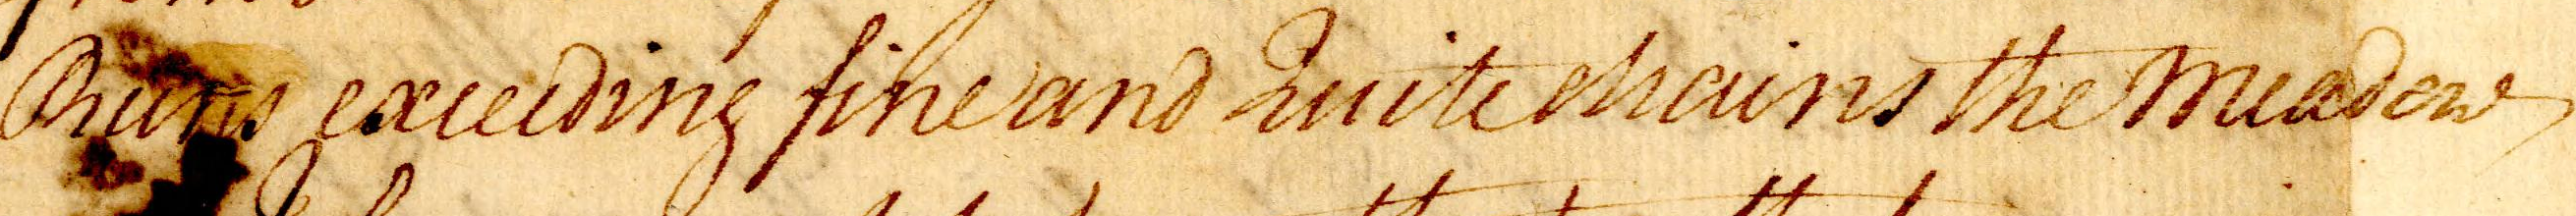Runs exceeding fine and Quite chains the meadow
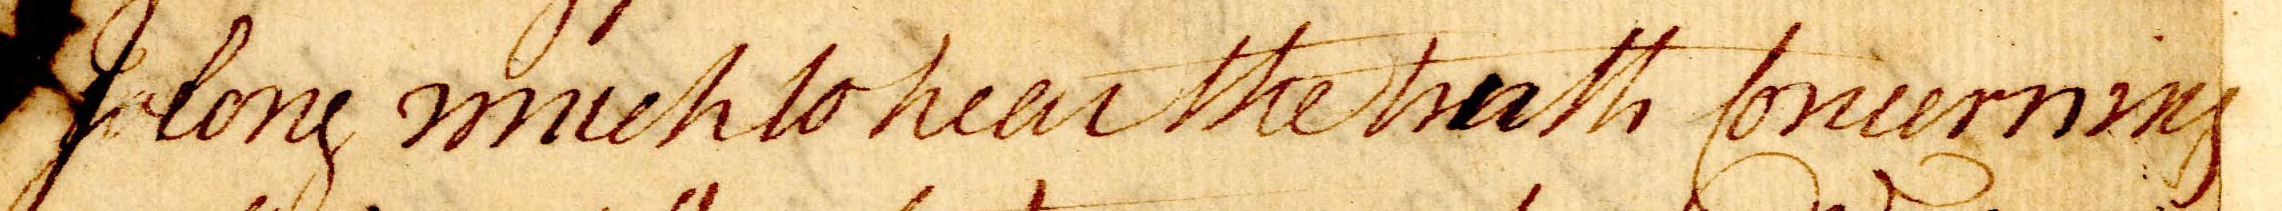I long much to hear the truth Concerning
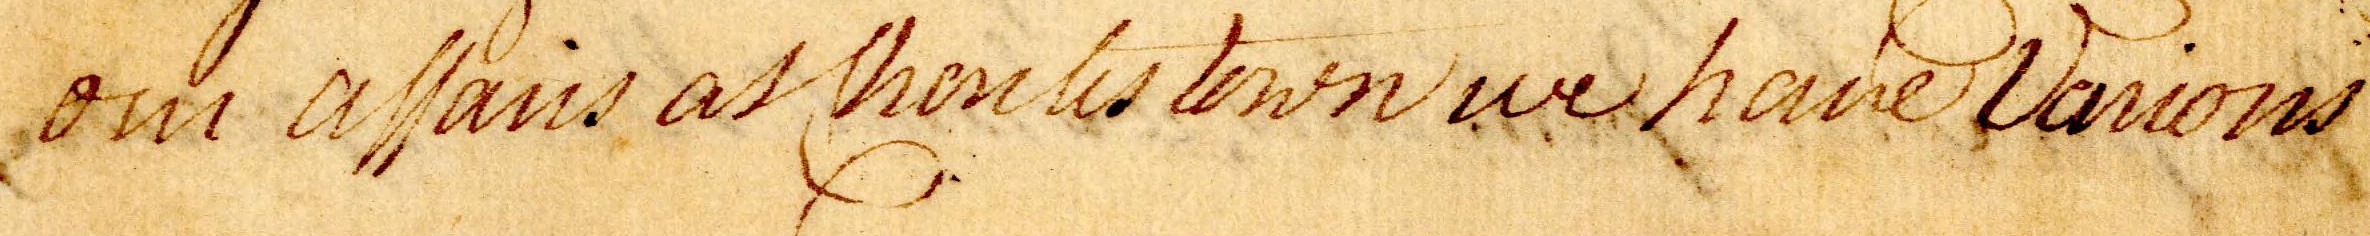our Affairs at Charlestown we have Various
